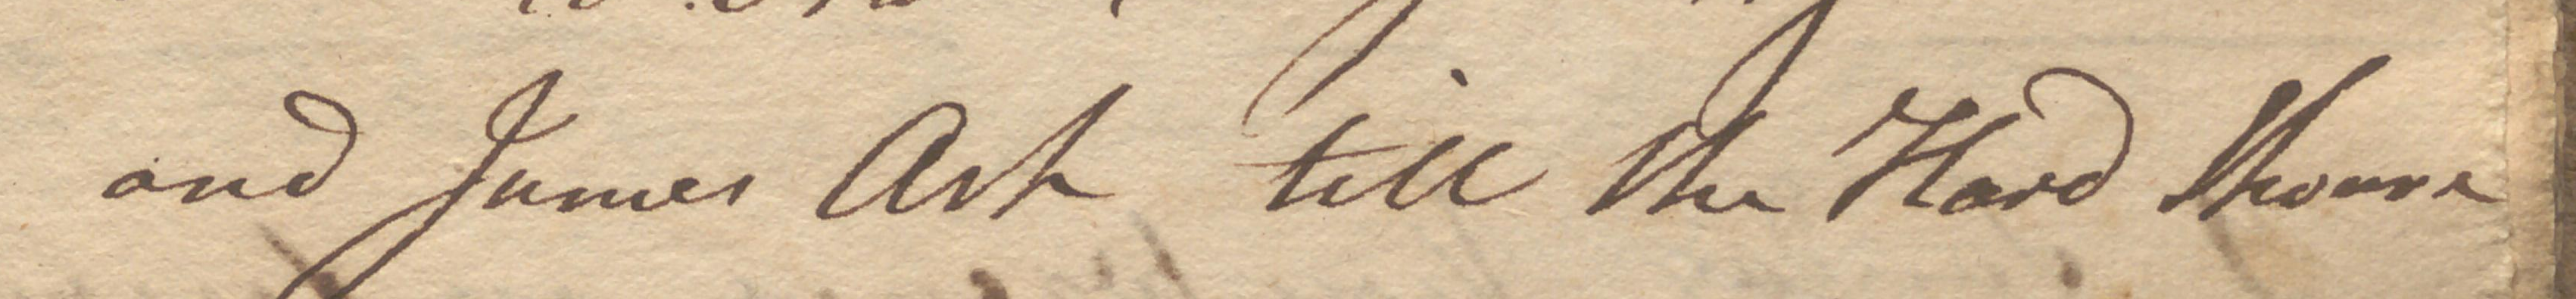and James Ash till the Hard Shoure
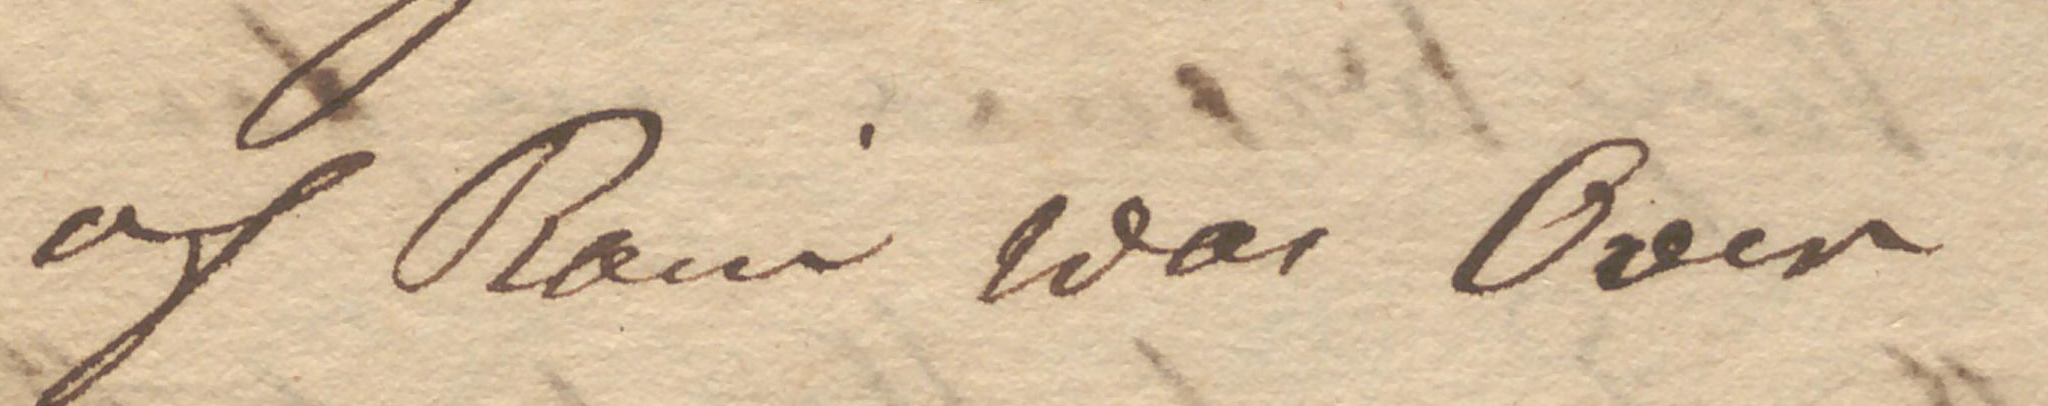of Rain was over
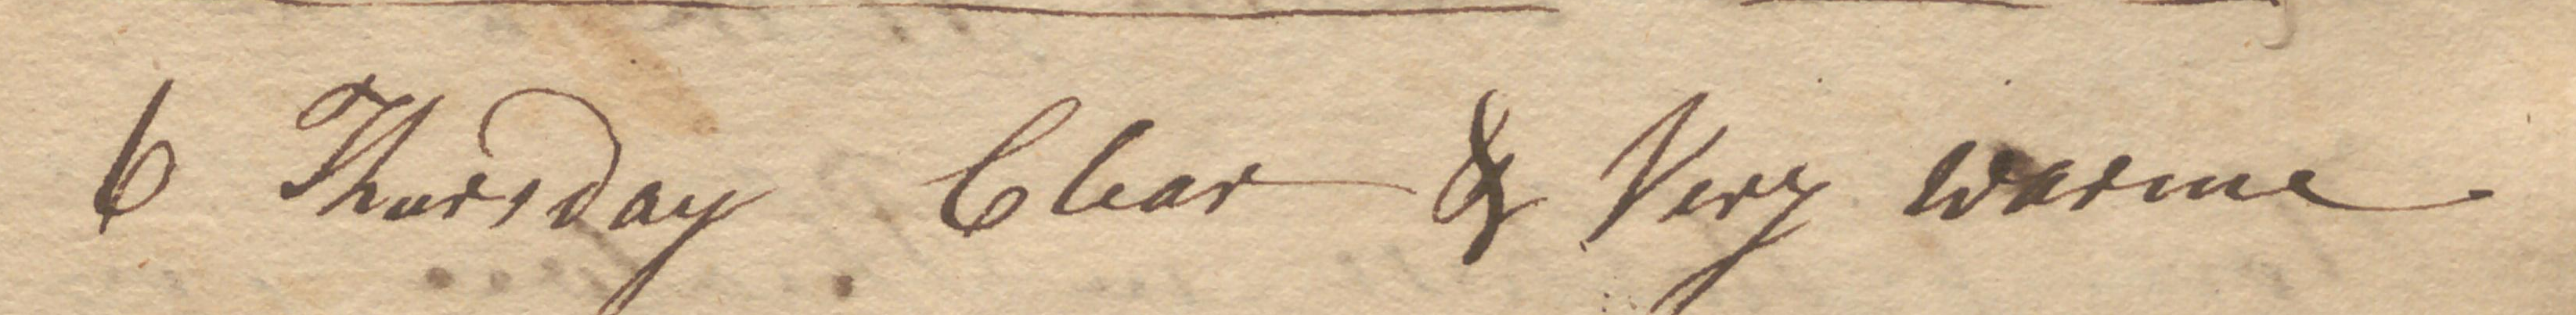6 Thursday Clear & Very warme
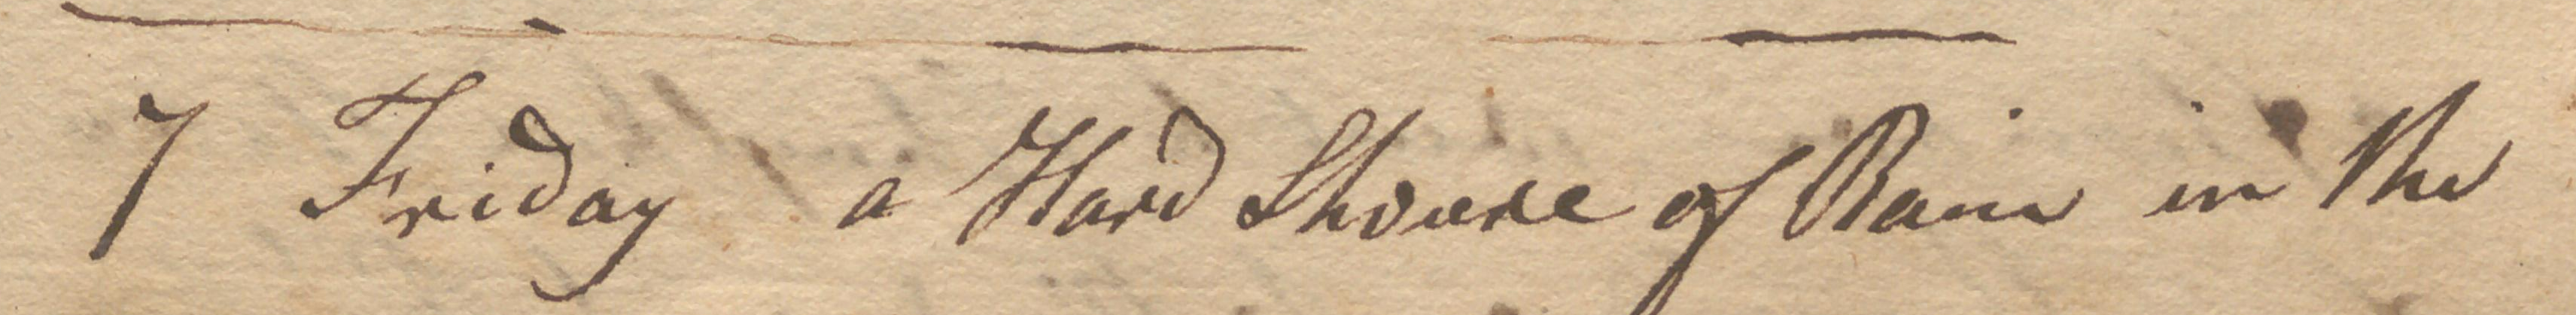7 Friday a Hard Shoure of Rain in the
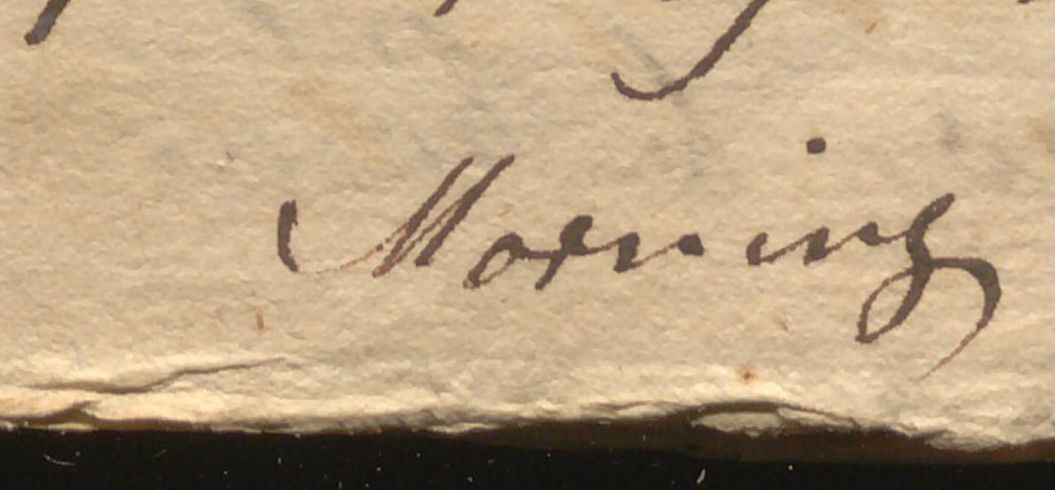Morning
